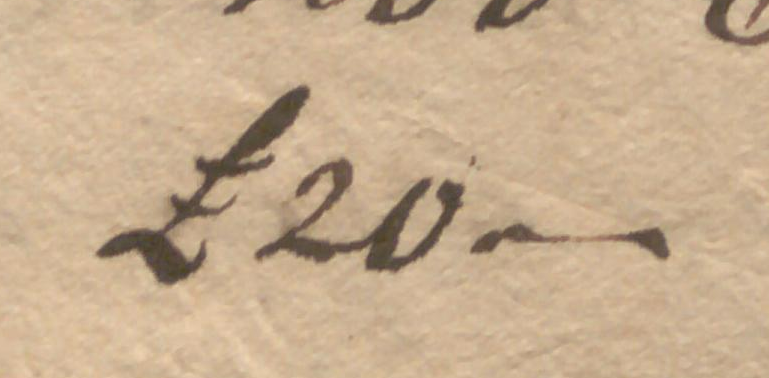£20-
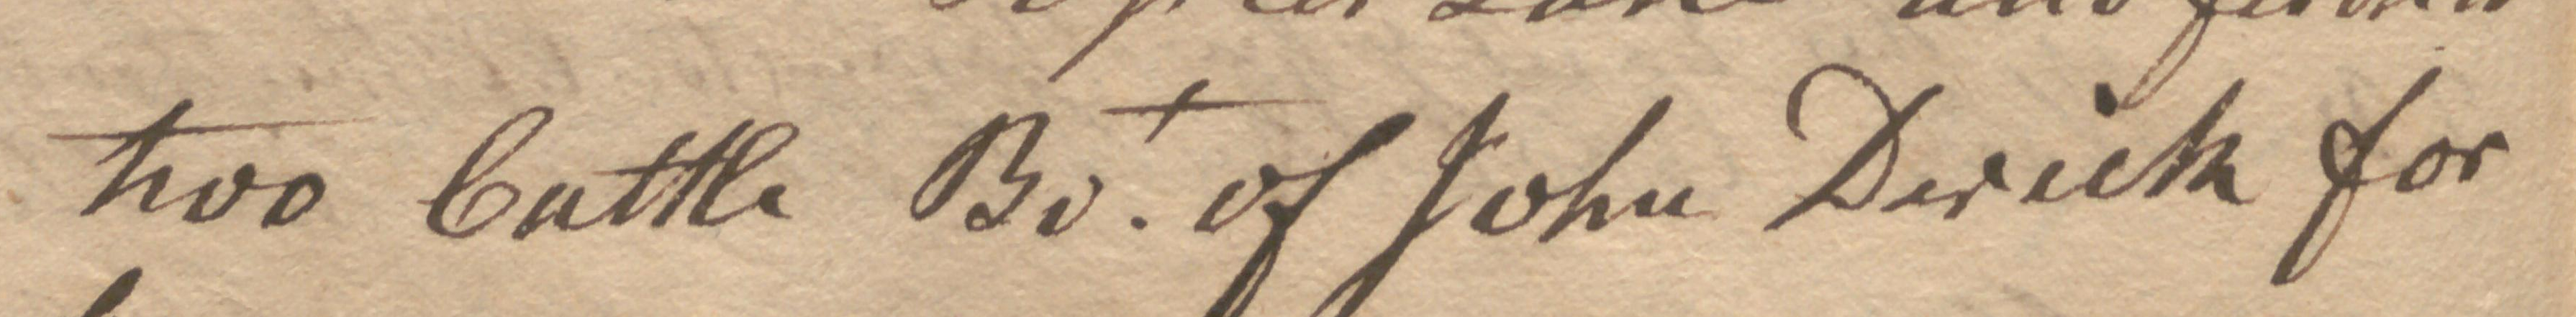two Cattle Bo^t. of Johu Derick for
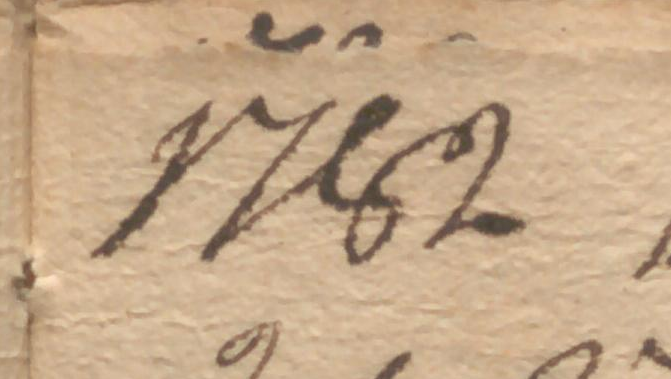1782
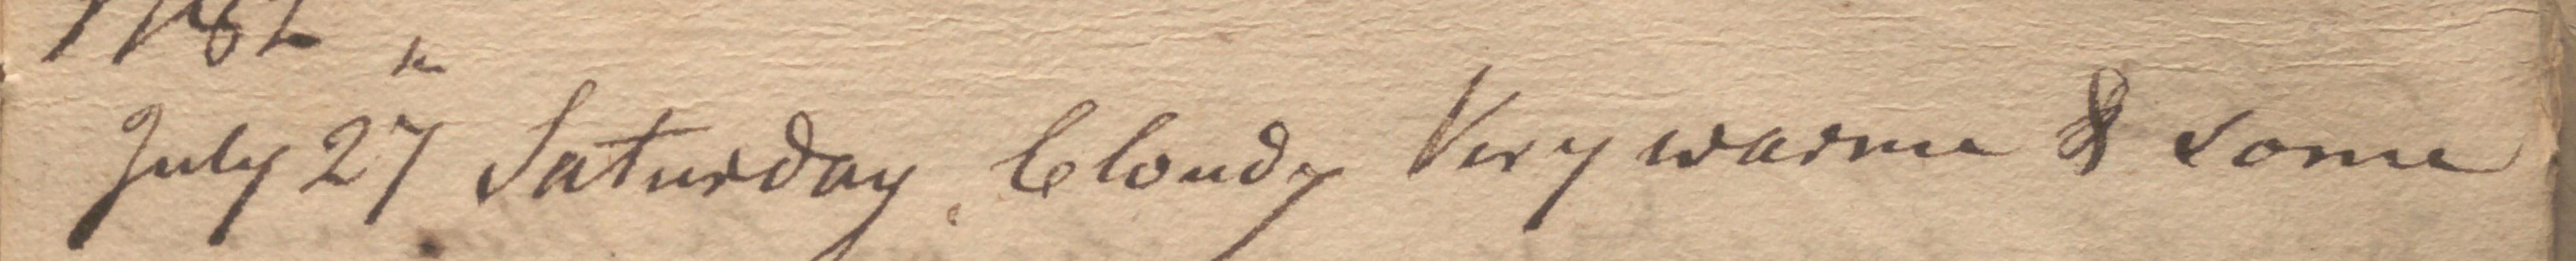July 27 Saturday Cloudy Very warme & some
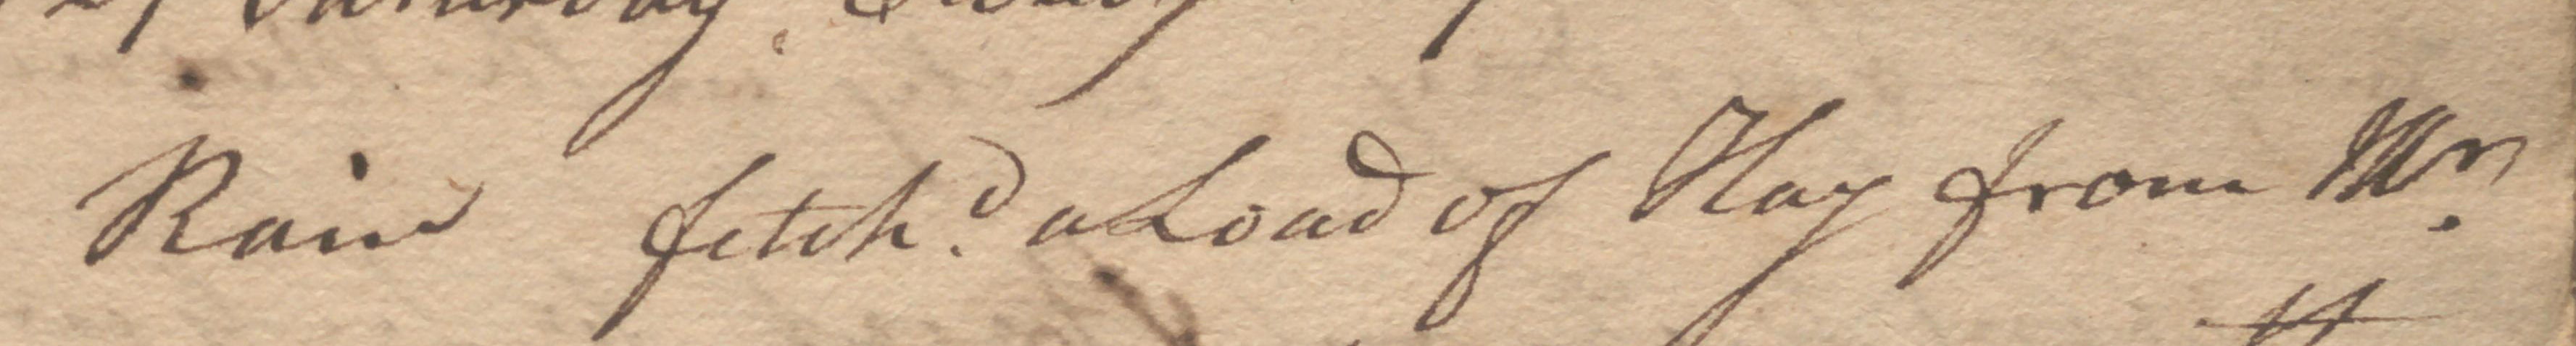Rain fetch^d. a Load of Hay from M^r.
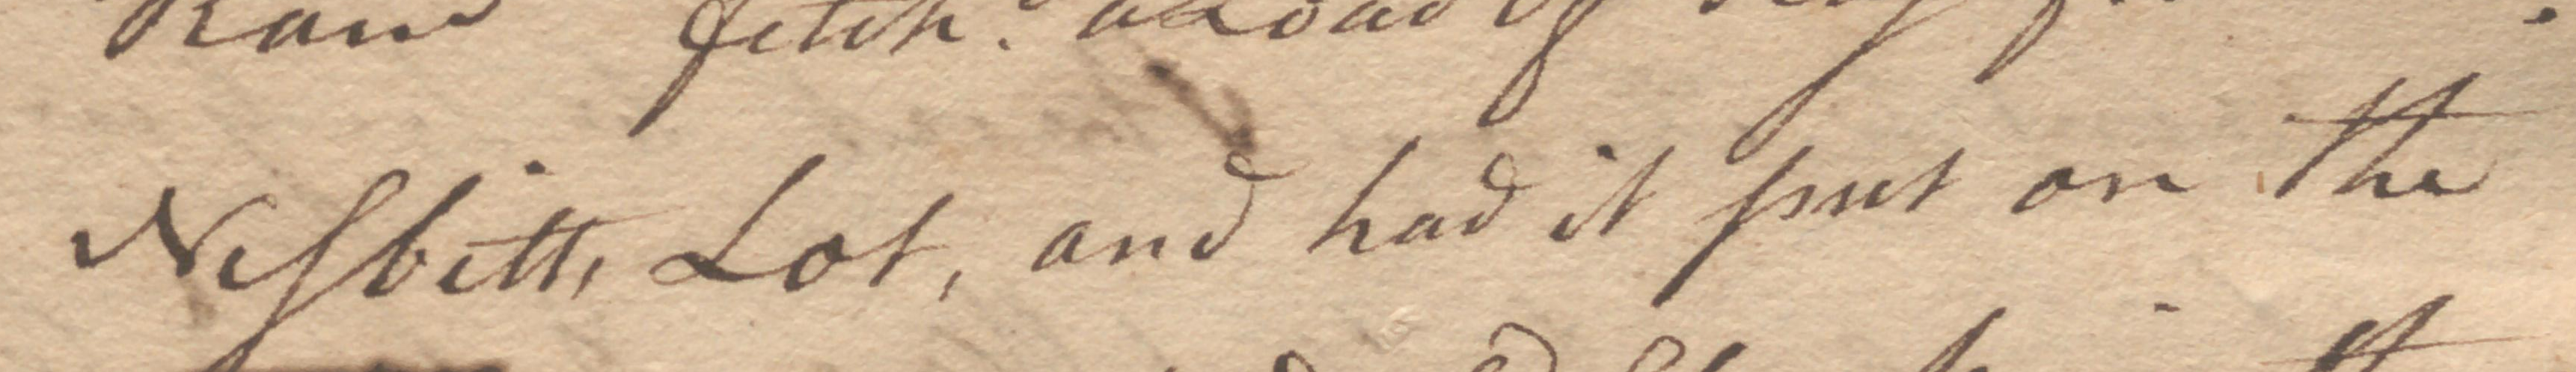Nesbitts Lot, and had it put on the
